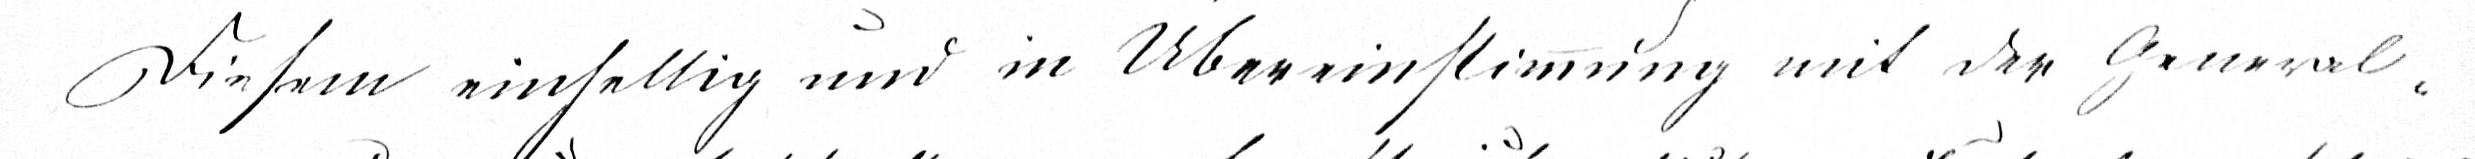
Diesem einhellig und in Übereinstimmung mit der General¬
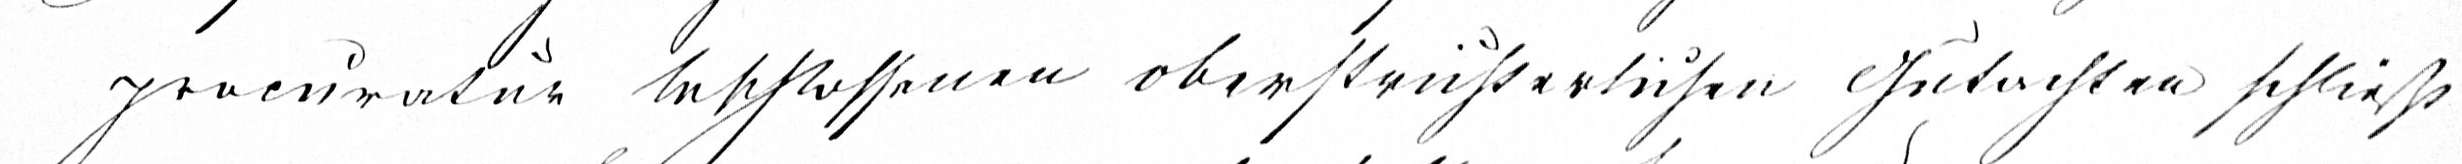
procuratur lexxossenen oberstrichterlichen Gutachten schließ
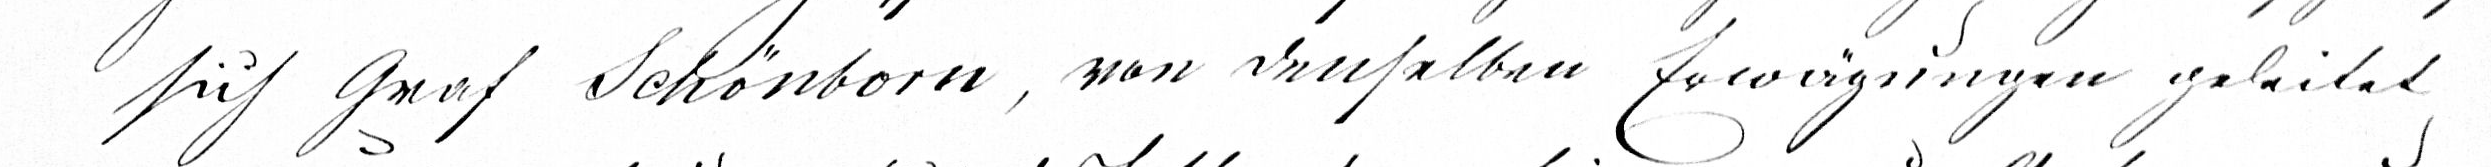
sich Graf Schönborn, von denselben Erwägungen geleitet
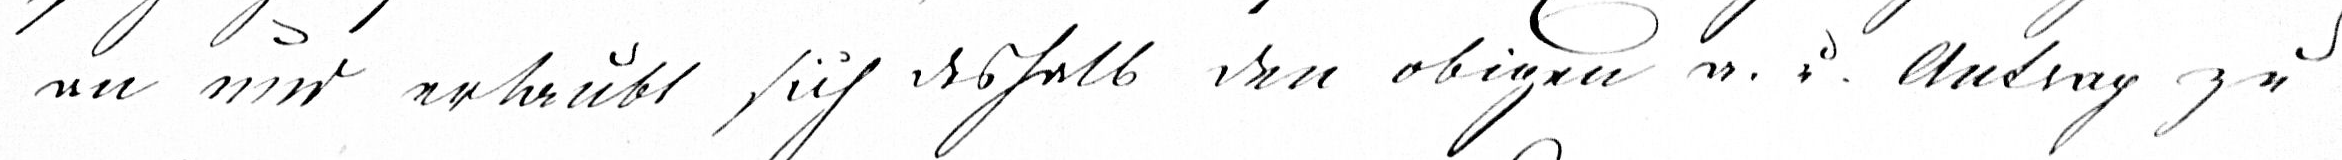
an und erlaubt sich deshalb den obigen a. u. Antrag zu
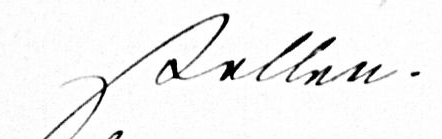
stellen.
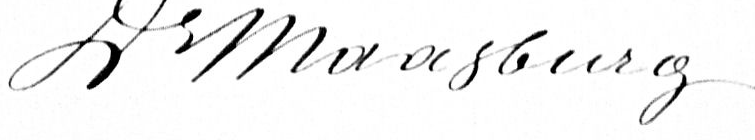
Dr. Maasburg
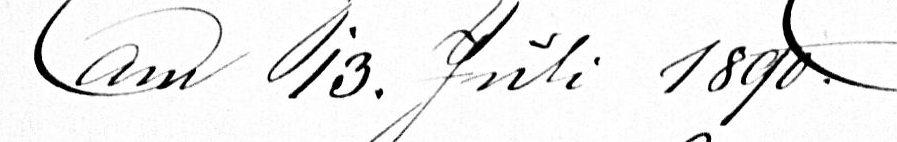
Am 13. Juli 1890.
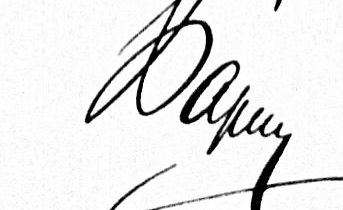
xx
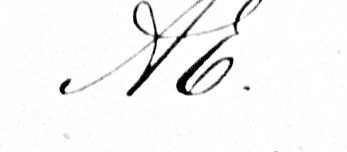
AE.
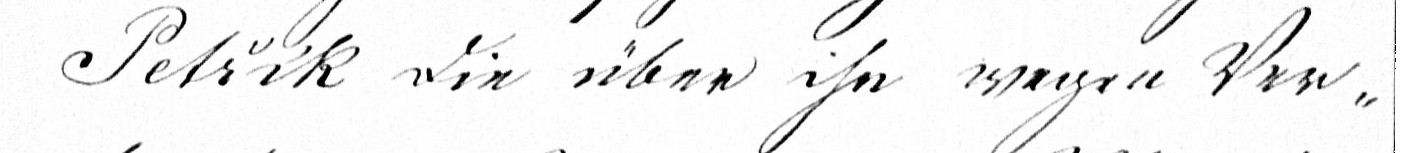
Petxxk die über ihn wegen Ver¬
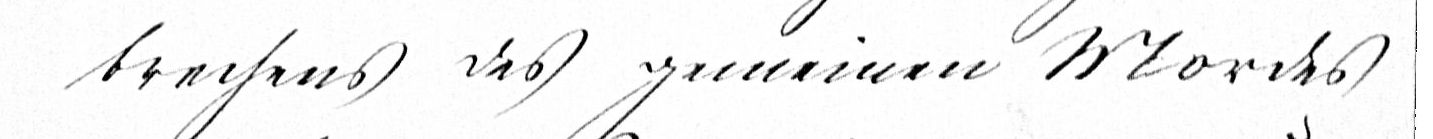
brechens des gemeinen Mordes
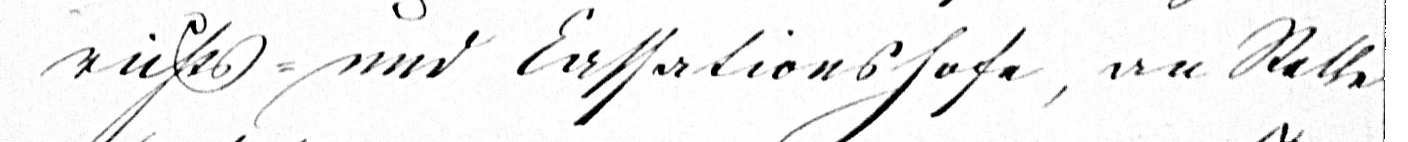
richts- und Cassationshofe, an Stelle
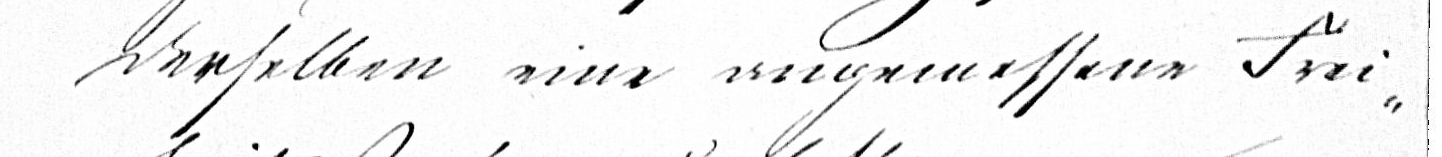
derselben eine angemessene Frei¬
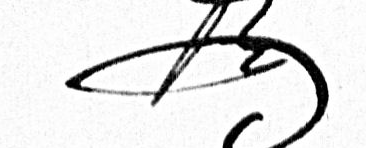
xx
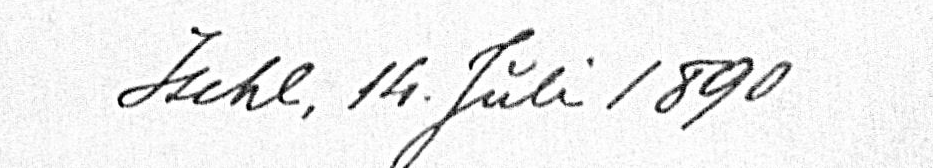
Ischl, 14. Juli 1890
